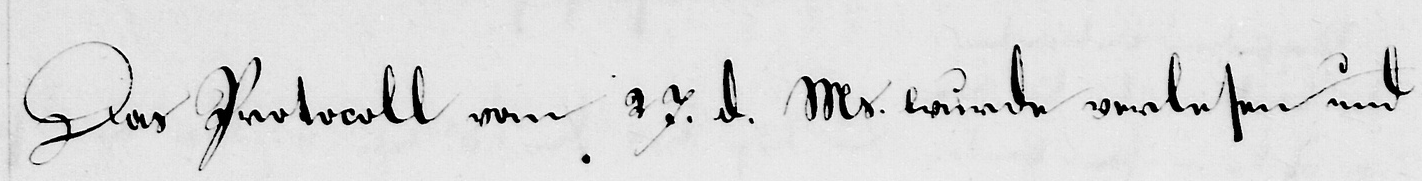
Das Protocoll vom 27. d. Ms. wurde verlesen und
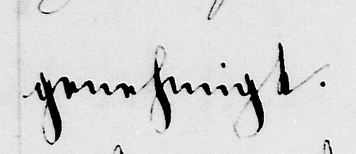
genehmigt.
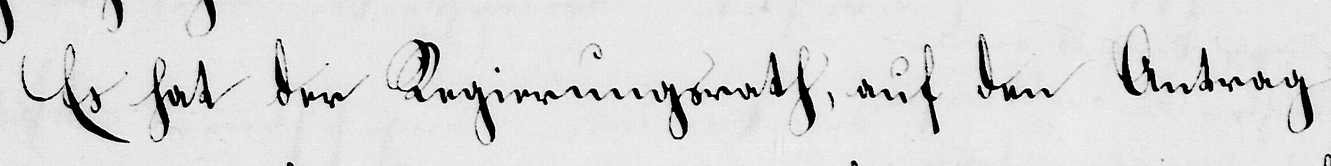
Es hat der Regierungsrath, auf den Antrag
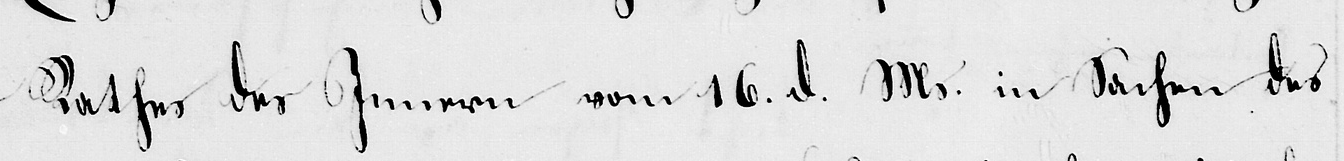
Rathes des Innern vom 16. d. Ms. in Sachen des
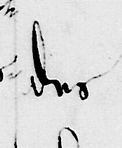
des
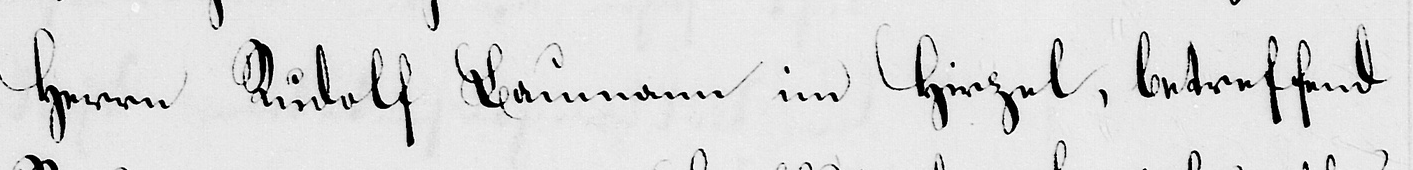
Herrn Rudolf Baumann im Hirzel, betreffend
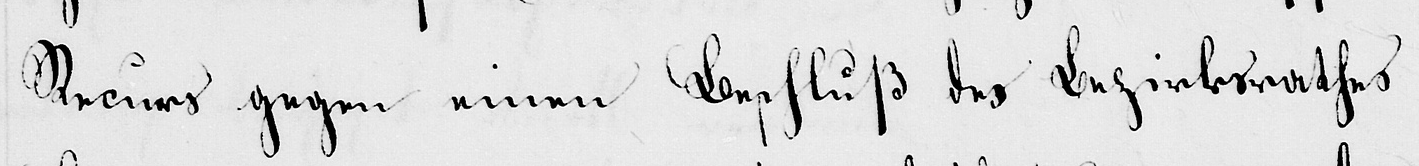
Recurs gegen einen Beschluß des Bezirksrathes
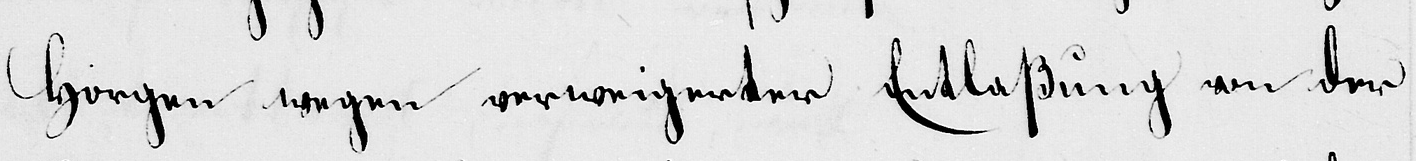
Horgen wegen verweigerter Entlaßung von der
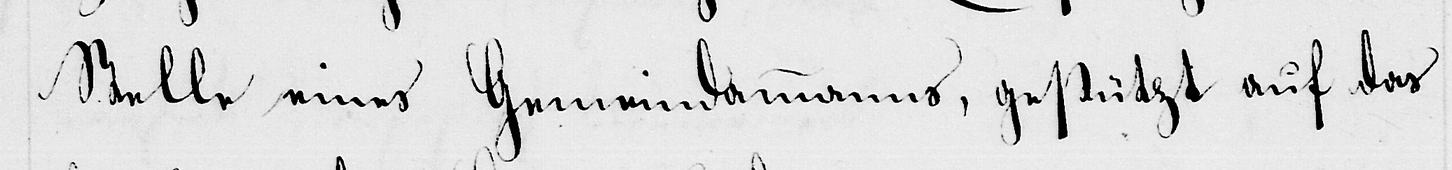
Stelle eines Gemeindammans, gestützt auf das
